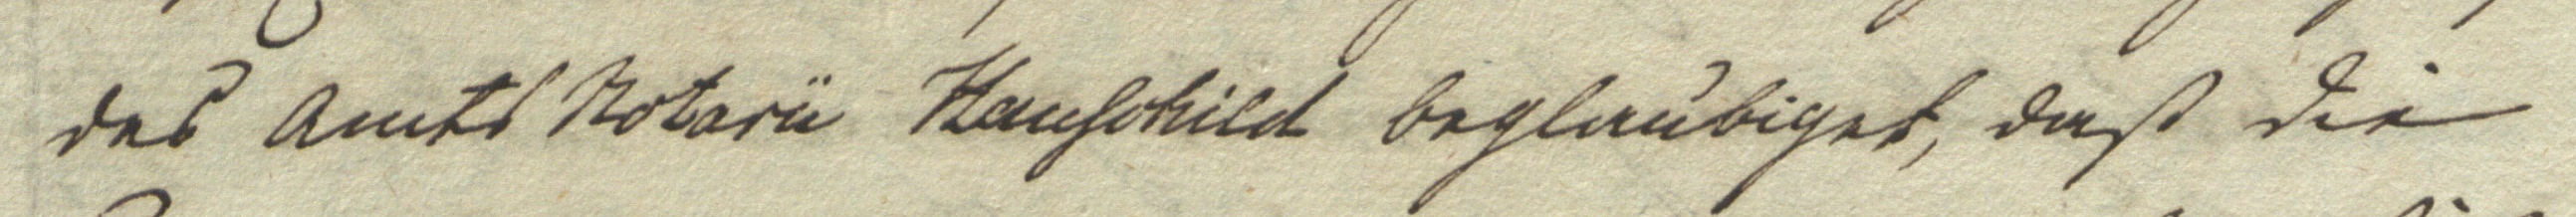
des Amts Notarii Hauschild beglaubiget, daß die
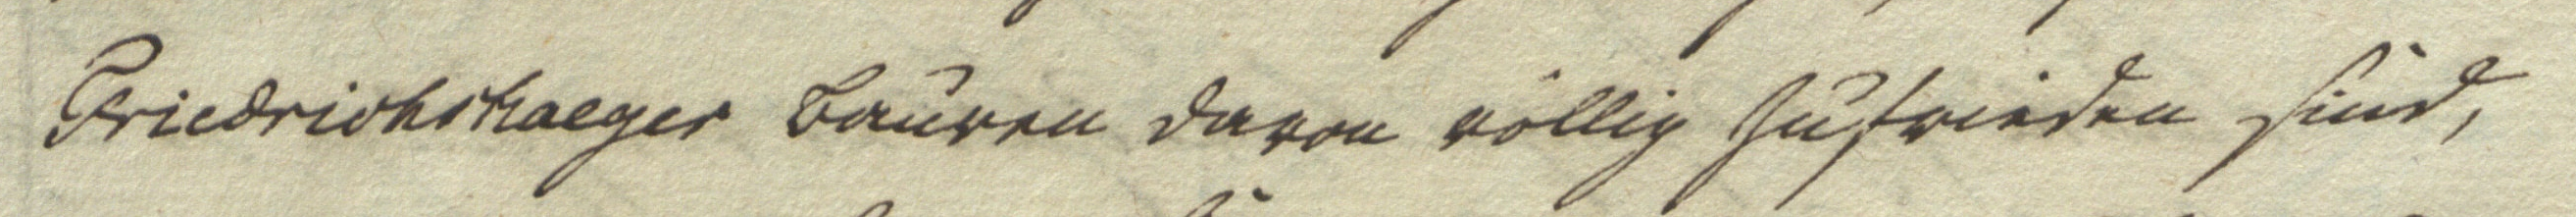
Friedrichshaeger Bauren davon völlig zufrieden sind,
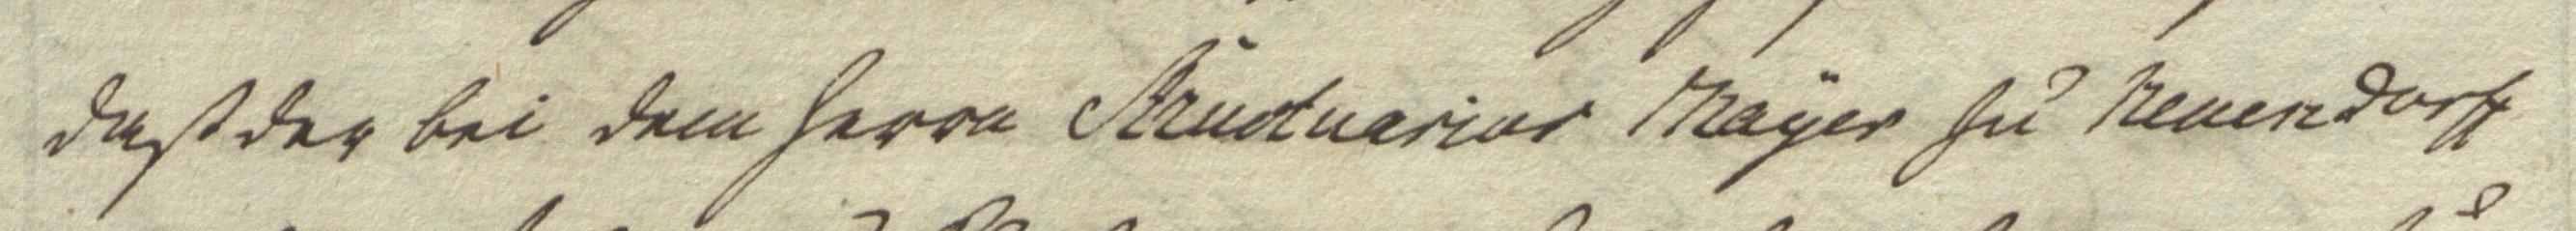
daß der bei dem Herrn Strutuarius Mayer zu Neuendorff
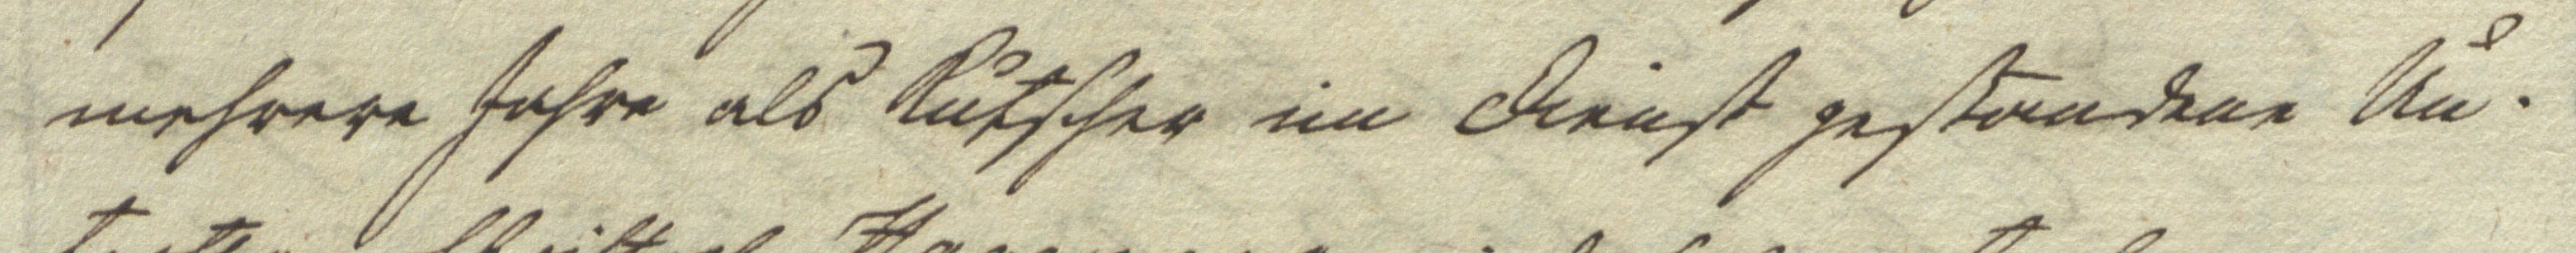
mehrere Jahre als Kutscher im Dienst gestandene Un¬
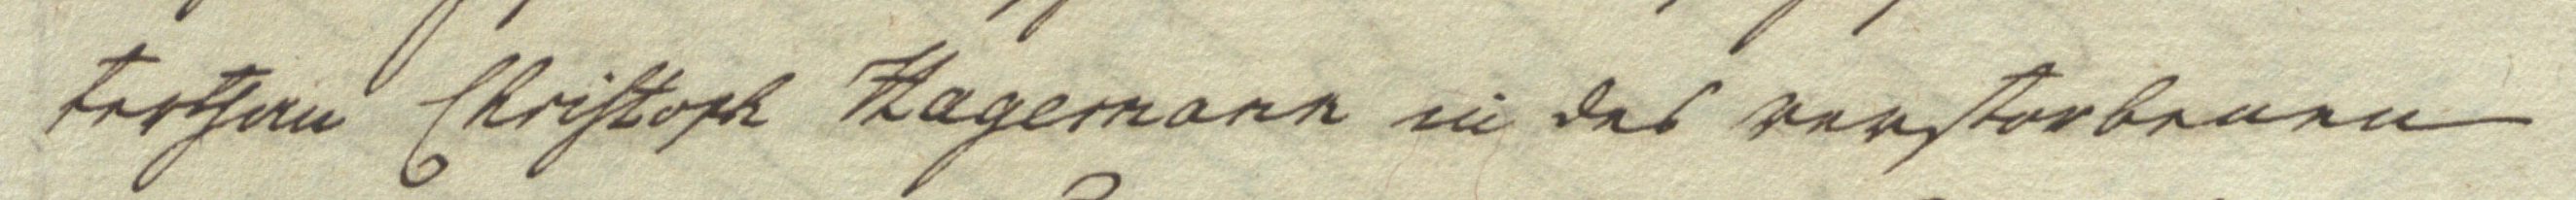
terthan Christoph Hagermann in des verstorbenen
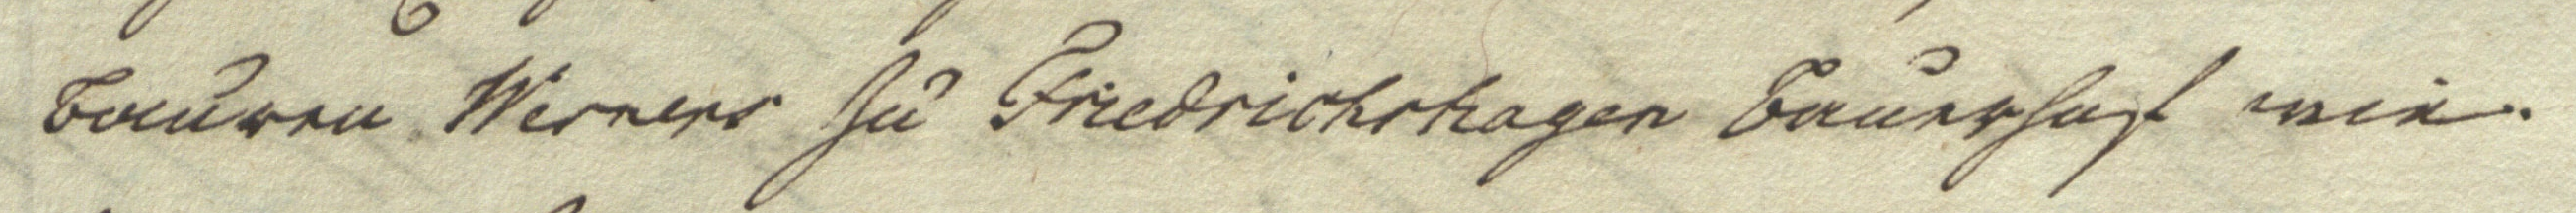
Bauren Werners zu Friedrichshagen Bauerhof wie¬
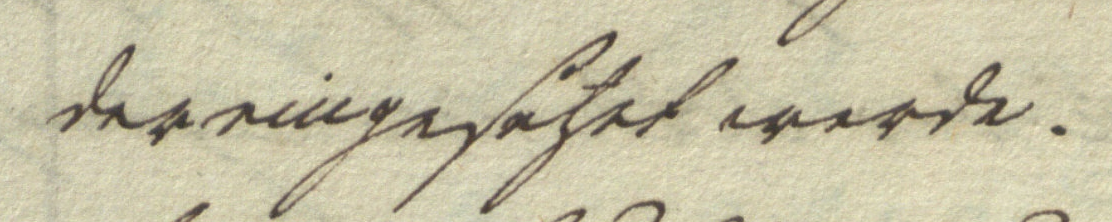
der eingesetzet werde.
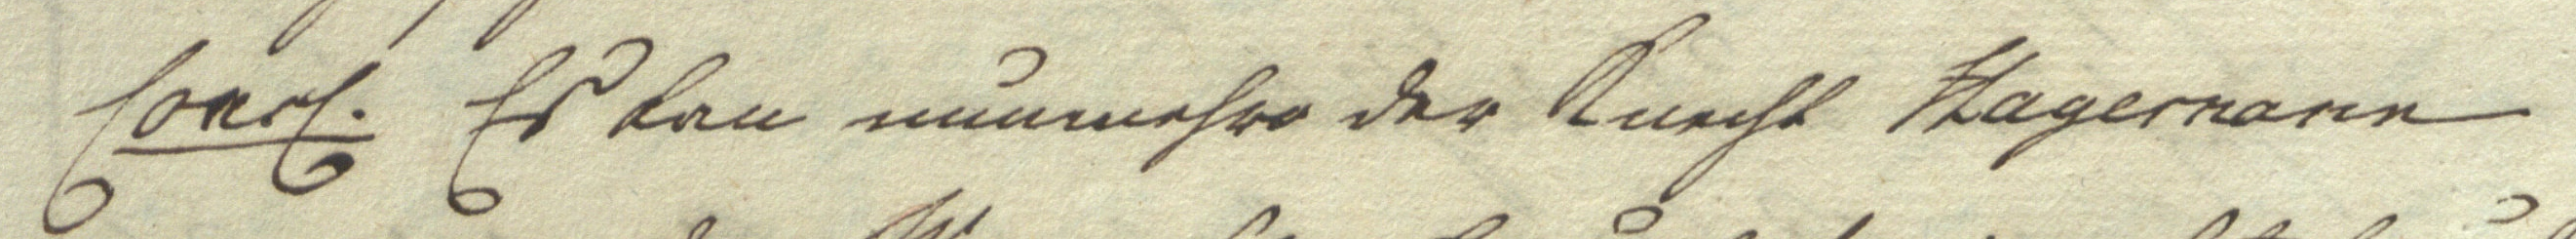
Concl. Es kan nunmehro der Knecht Hagermann
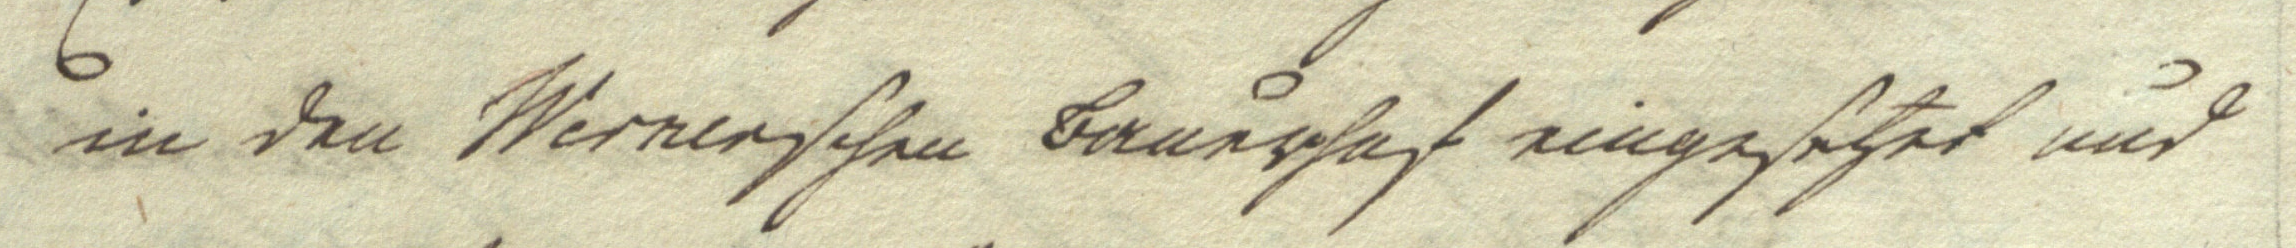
in den Wernerschen Bauerhof eingsetzet und
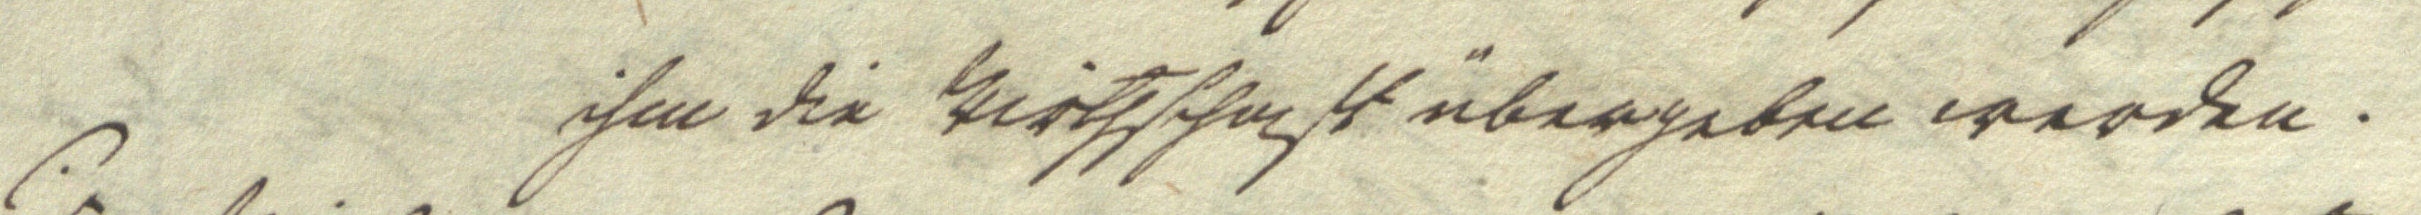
ihm die Wirthschaft übergeben werden.
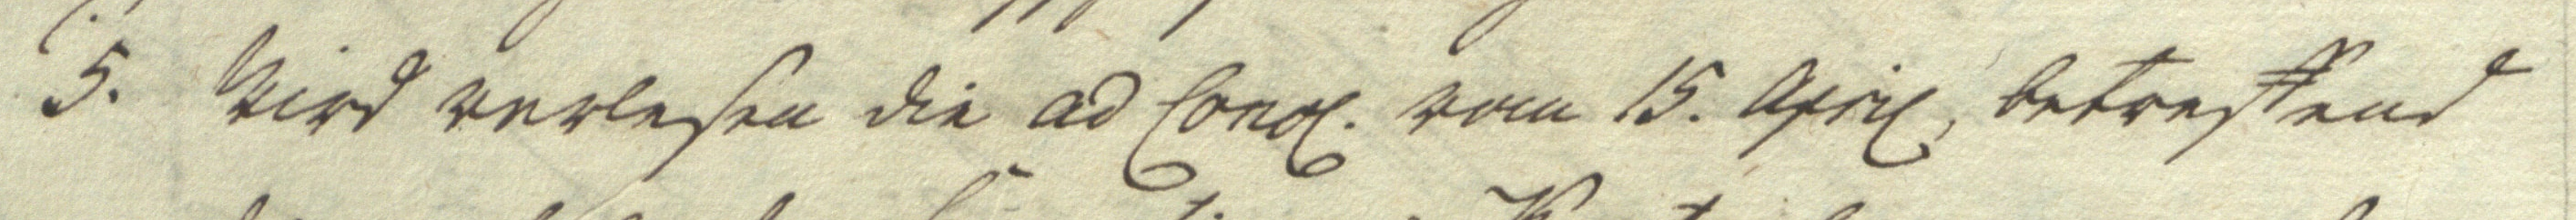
5. Wird verlesen die ad Concl. vom 15. April, betreffend
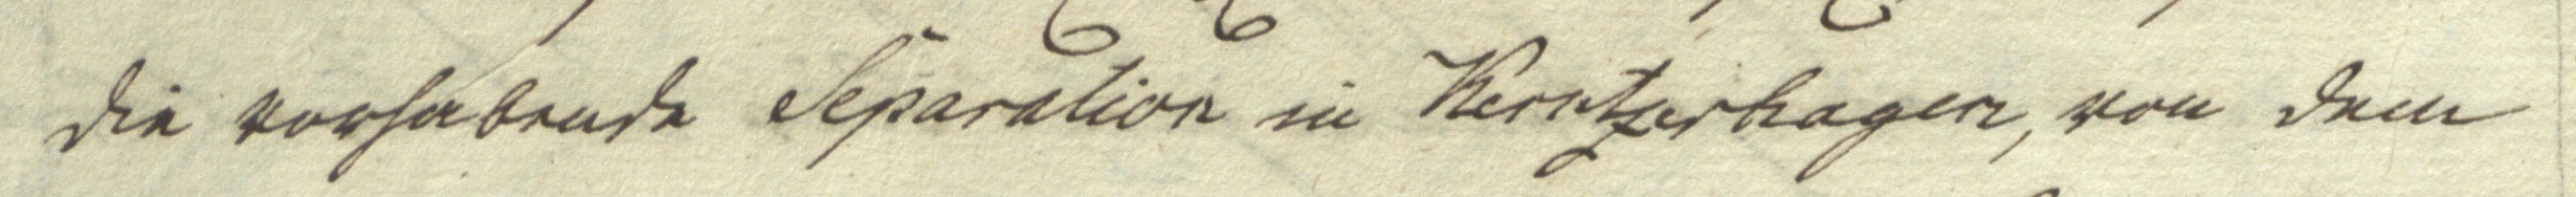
die vorhabende Separation in Kemtzerhagen, von dem
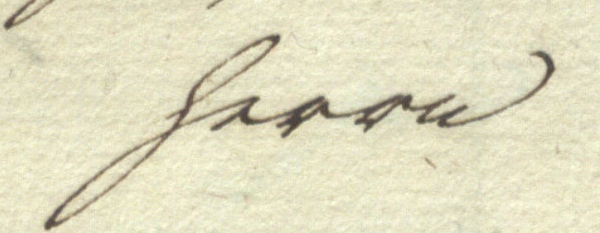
Herrn
